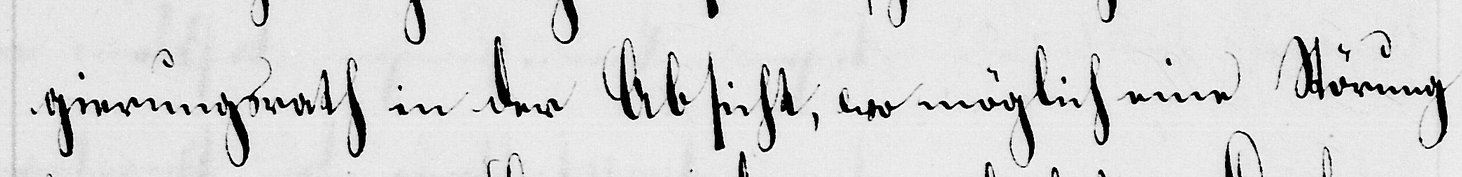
gierungsrath in der Absicht, wo möglich eine Störung
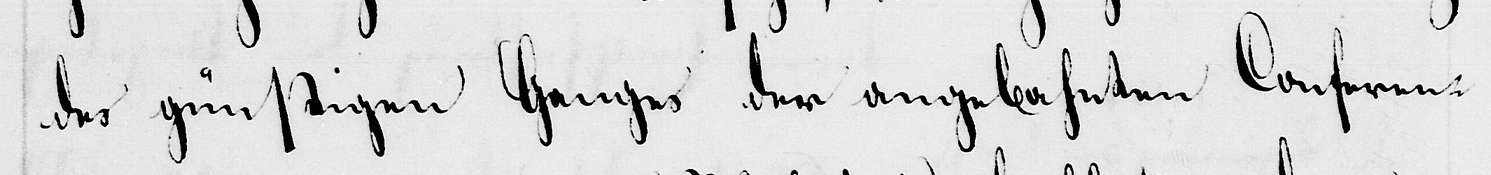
des günstigen Ganges der angebahnten Conferen¬
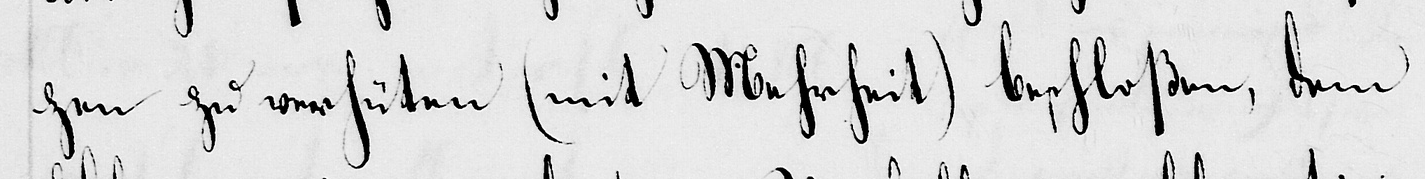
zen zu verhüten (mit Mehrheit) beschloßen, dem
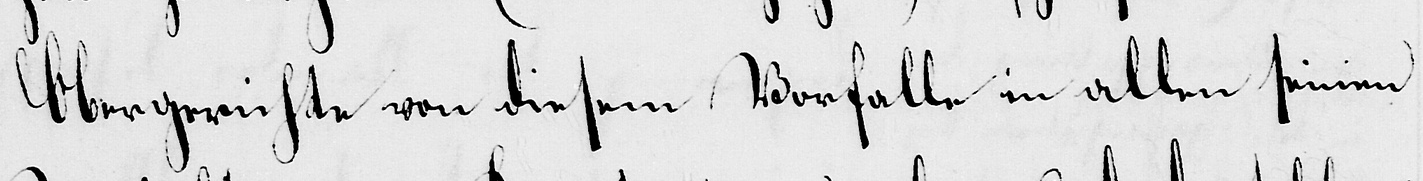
Obergerichte von diesem Vorfalle in allen seinen
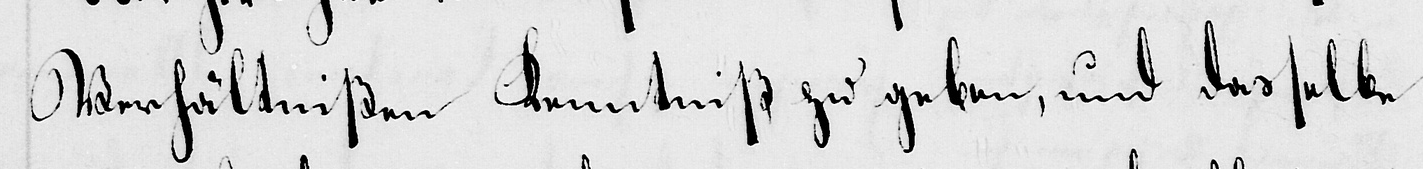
Verhältnißen Kenntniß zu geben, und dasselbe
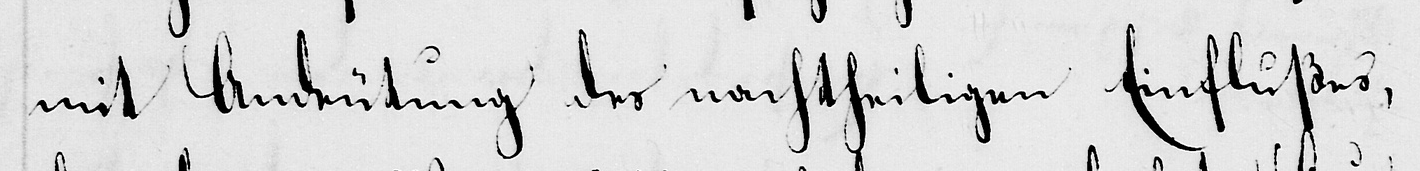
mit Andeutung des nachtheiligen Einflußes,
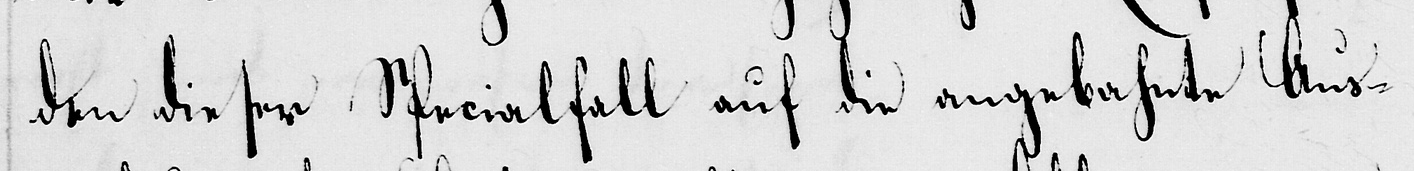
den dieser Specialfall auf die angebahnte Aus¬
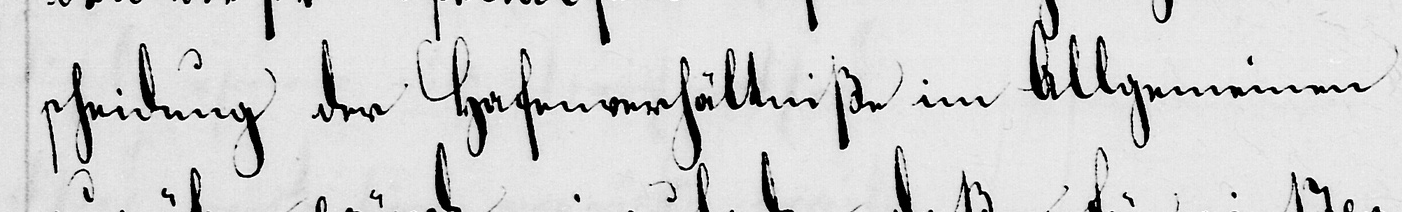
scheidung der Hafenverhältniße im Allgemeinen
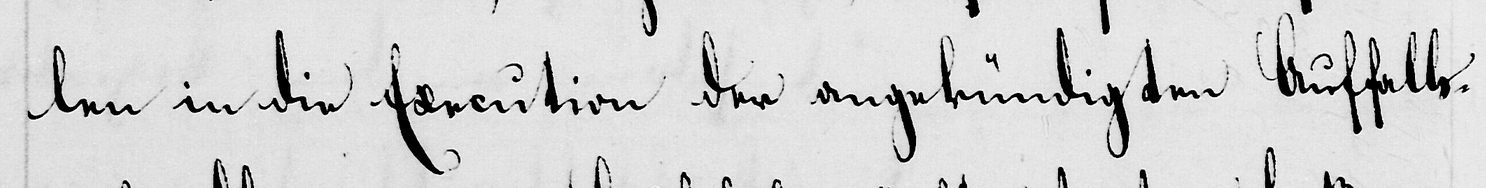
len in die Execution der angekündigten Auffalls¬
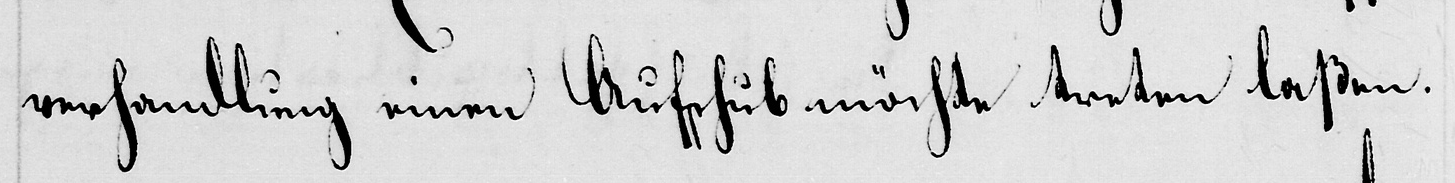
verhandlung einen Aufschub möchte treten laßen.
